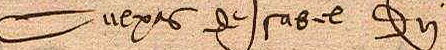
Culpas de Jsabel dīz
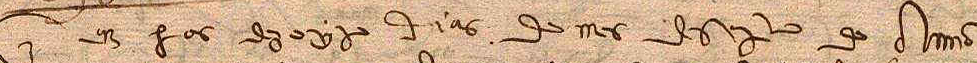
item em hos dezoyto dias do mes de setro do Anno
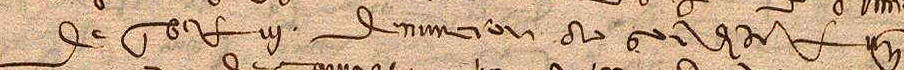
de j̄ bc Riij. denunciou Ao sor̄ dtor Ruy
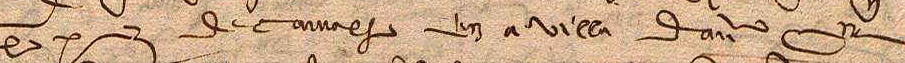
lopez de carualho em a villa dauro Cna
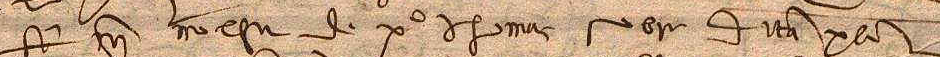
ffr̄rz molher de po thomas sobre dita plō
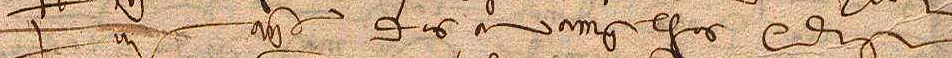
Juramto dos avamgelhos e dise
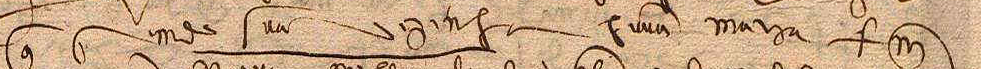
q̄ semdo sua vezinha huūa marta frr̄z
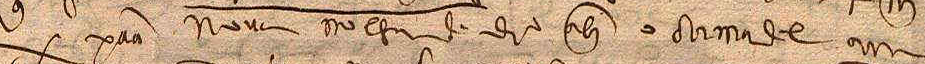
Xpāa noua molher de djo ālz o Armadel que
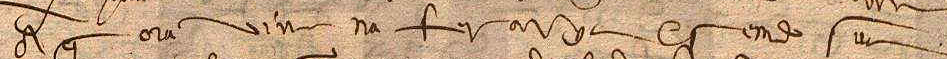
Agora viue na ferarya e semdo sua
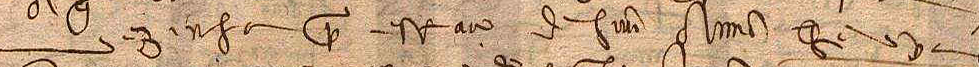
vezinha p̄o espaço de huū Anno lhe vya
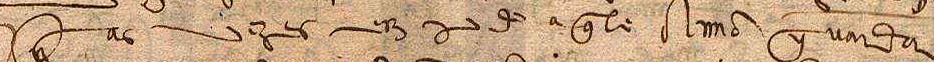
mtas vezes em todo aq̄le Anno guardar
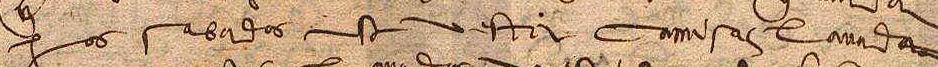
hos sabados e se vestir camisas lauada
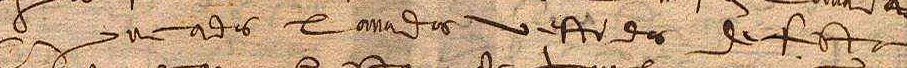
e toucados lauados vestidos de festa
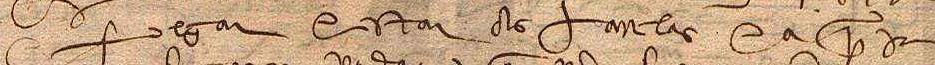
e folgar e estar As Janelas e a p̄ota
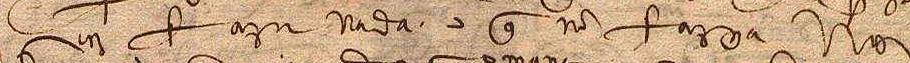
sem fazer nada . o que nō fazya nos
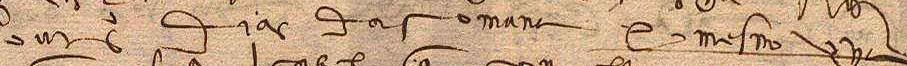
outos dias da somana e o mesmo vya
